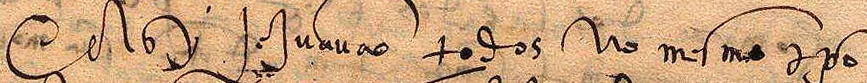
e Asy JeJuauão todos No mesmo tpō
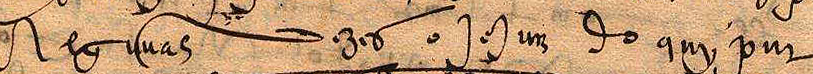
Alguūas vezes o JeJum do quypur
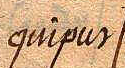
quipur
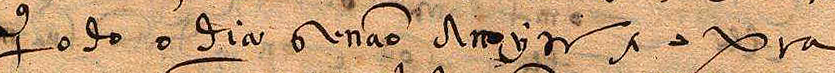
todo o dia senão A noyte e o pra
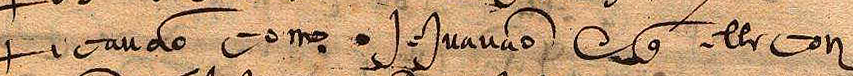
ticauão como o JeJuauão e q̄ elle con
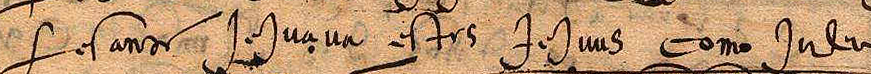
fesante JeJuaua estes JeJuus como Judeu
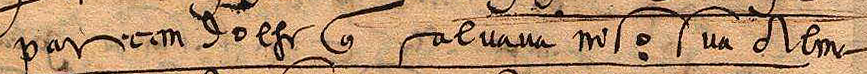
parecemdolhe q̄ saluaua niso sua Alma
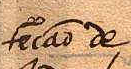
tēção de
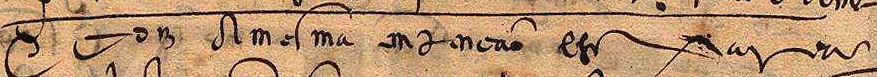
e com A mesma emtençaõ lhe parecia
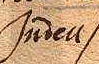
Judeu
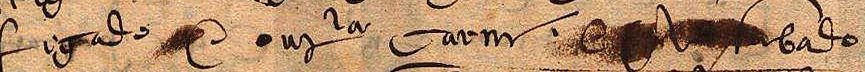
figado e outra carne e _ sabado
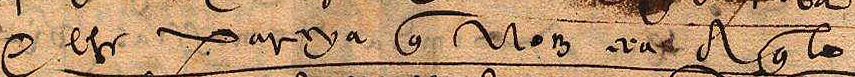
e lhe parecya q̄ Nom era Aq̄lo
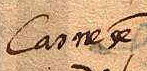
Carne sē
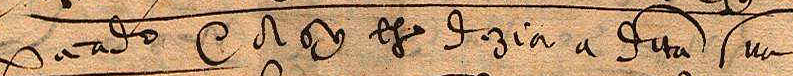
pecado e Asy lhe dezia a dīta sua
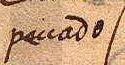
peccado
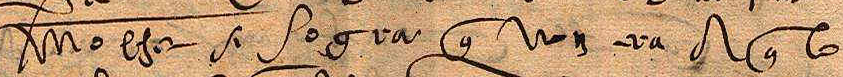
Molher e sogra q̄ nom era Aq̄lo
